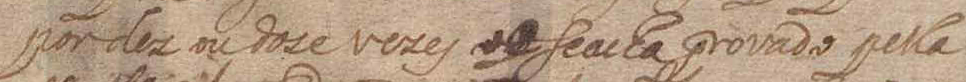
por dez ou doze vezes o q̄ se acha provado pella
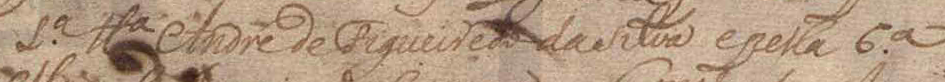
1.a tt.a Andre de Figueiredo da Silva e pella 6.a
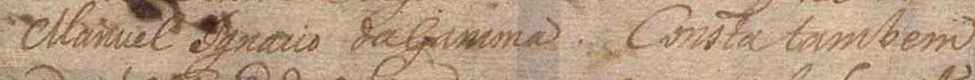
Manuel Ignacio da Gamma. Consta tambem
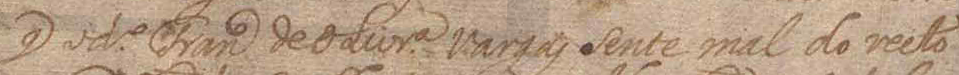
q̄ o d.o Fran.co de OLivr.a vargas sente mal do recto
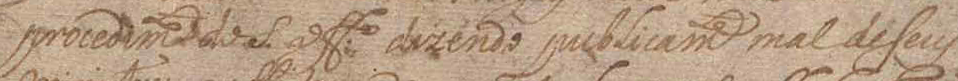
procedim.to do S. off.o dizendo publicam.te mal de seus
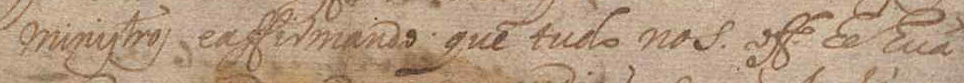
ministros e affirmando que tudo no s. off.o he huā
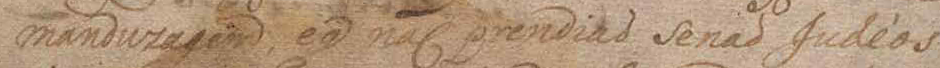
manduzagem, e q̄ naõ prendiaõ senaõ Judéos
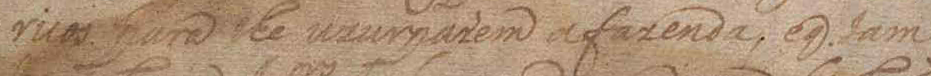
ricos para lhe uzurparem a fazenda, e q̄ tam
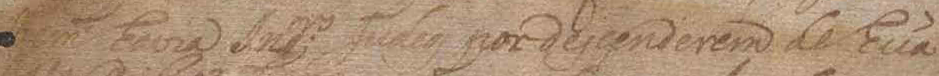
bem havia Inq.ors Judeos por descenderem de huā
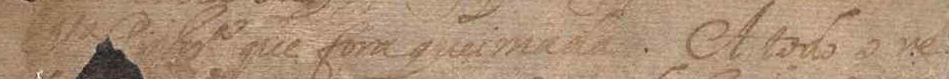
Ma Pinhra que fora queimada. A todo o re
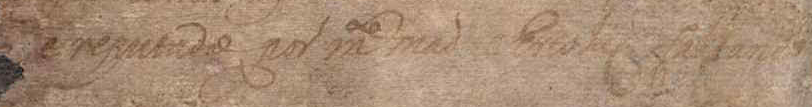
e reputado por mto mao christaõ faltando
